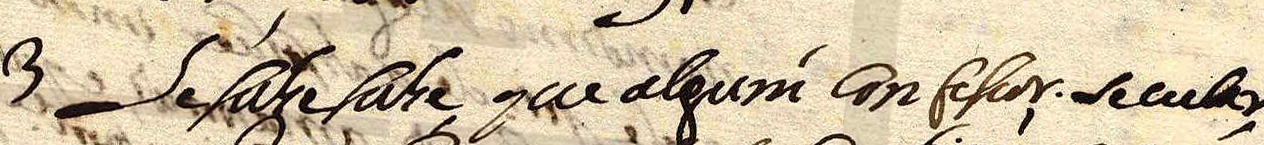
3 Se sabe sabe que algum confessor. secular
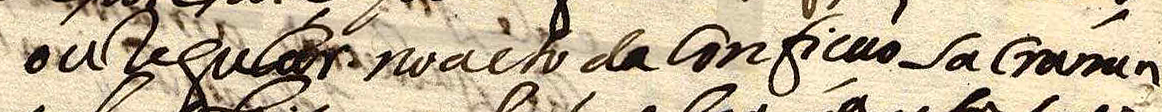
ou Regular no acto da confiçaõ sacramen
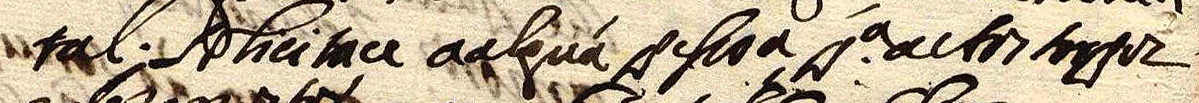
tal. solcitaçe a alguā pessoa p.a actos torpez
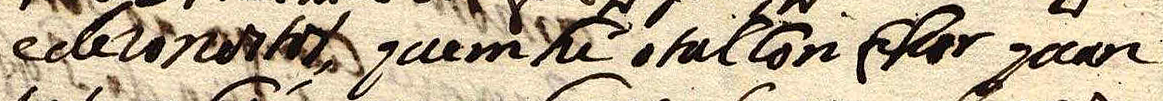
e dezonestos, quem hé o tal confessor quan
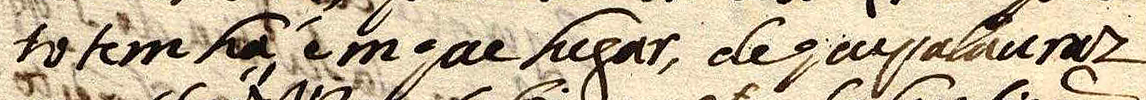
to tem há, em que lugar, de que palauraz
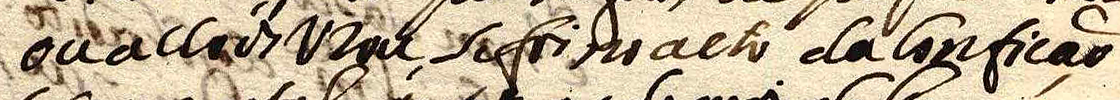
ou acçois vzou, se foi no acto da Confiçaõ
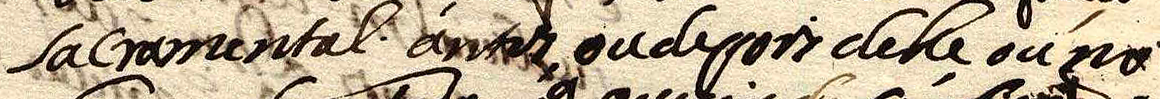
sacramental antes, ou depois delle ou no
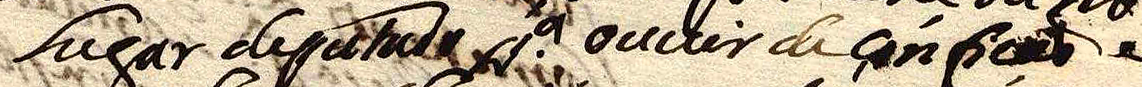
lugar deputado p.a ouuer de confiçaõ e
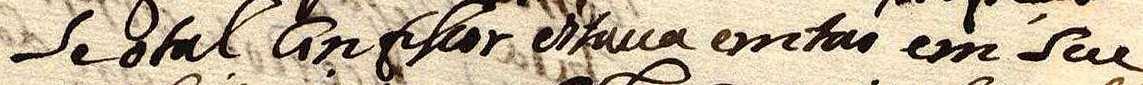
se o tal confessor estaua emtaõ em seu
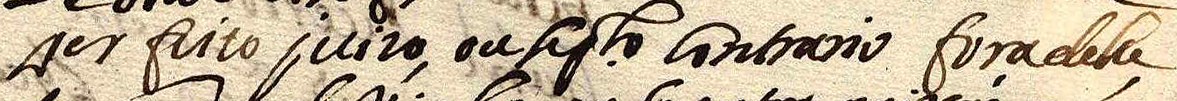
perfeito juizo, ou se p.lo contrario fora delle
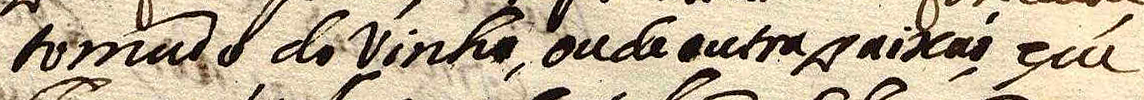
tomado do vinho, ou de outra paixaõ, que
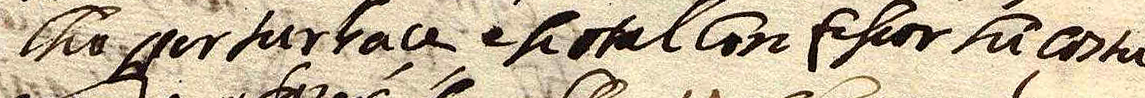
lho perturbaçe, e se o tal confessor he costu
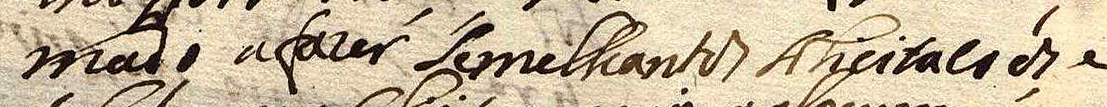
mado a fazer semelhantes Alicitações, e
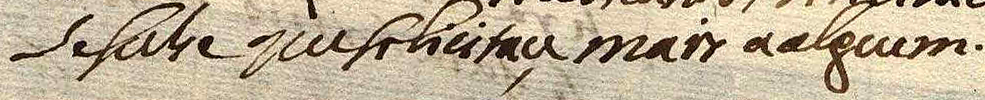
se sabe que solicitaçe mais a alguem.
